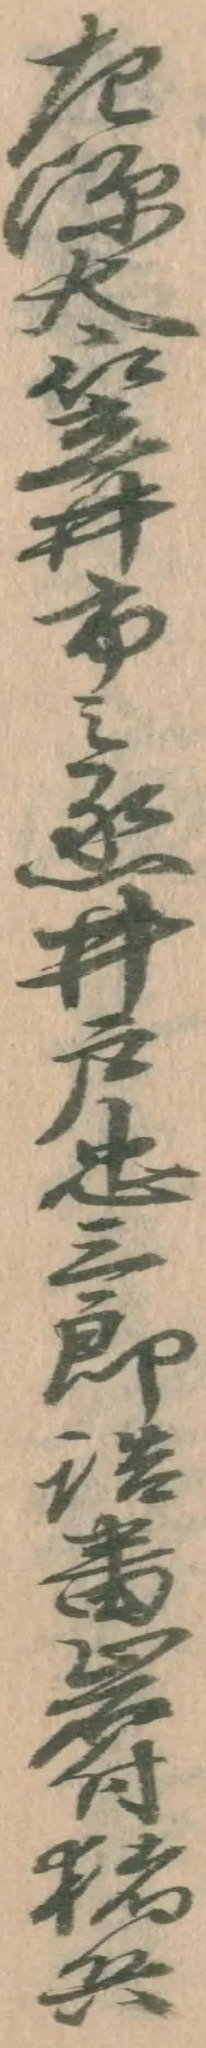左源太笠井市之丞井戸忠三郎詰番岩付猪兵
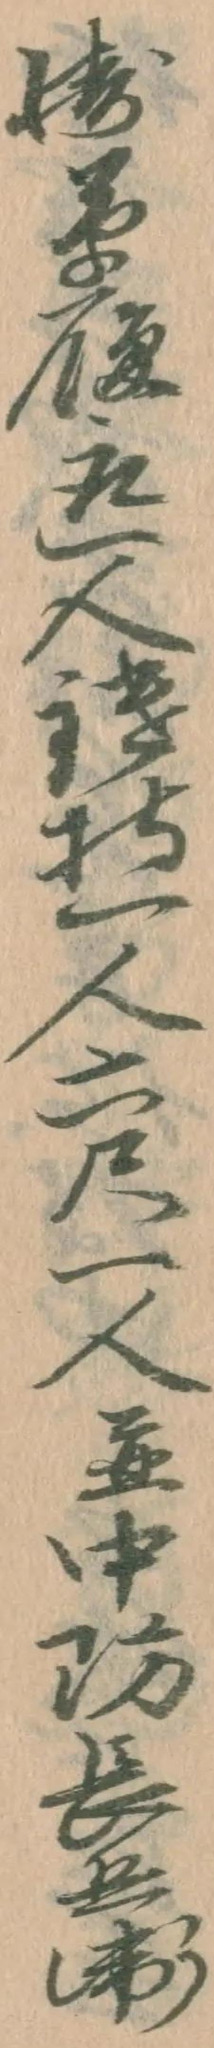衛草履取人鑓持一人六尺一人並中坊長兵衛
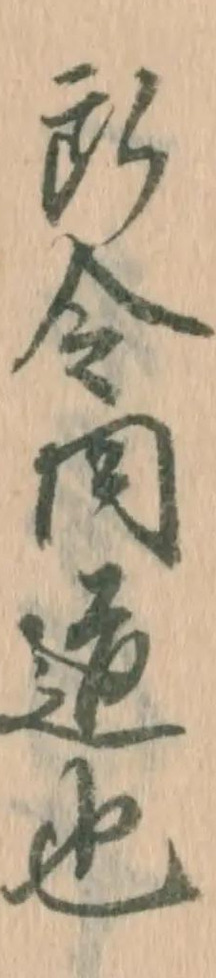所令同道也
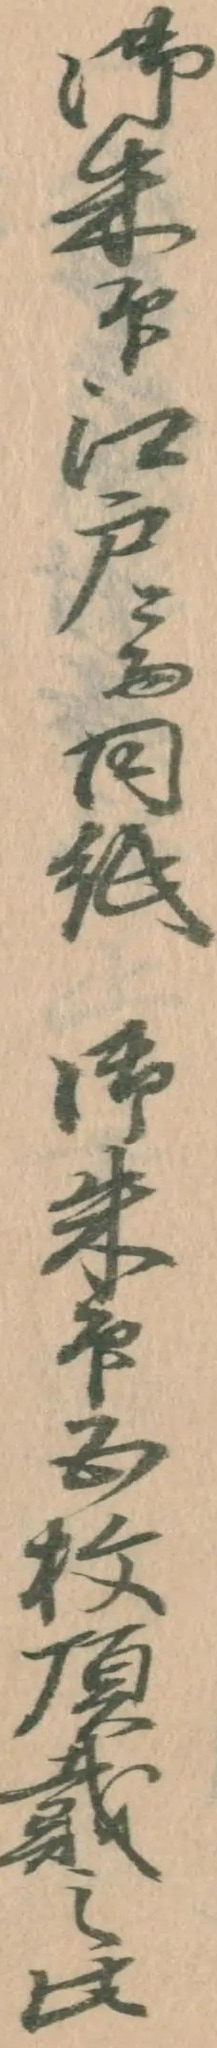御朱印江戸に而同紙御朱印五枚頂戴之此
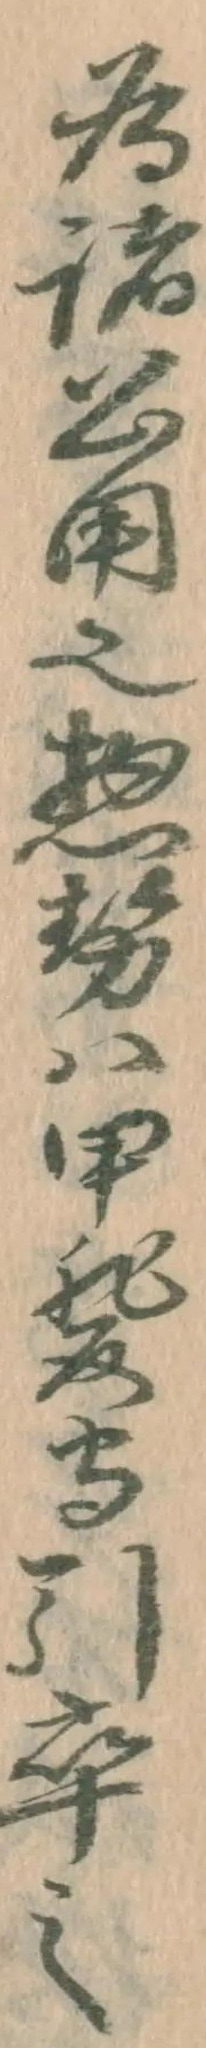為諸公用也惣勢は甲斐守引卒之
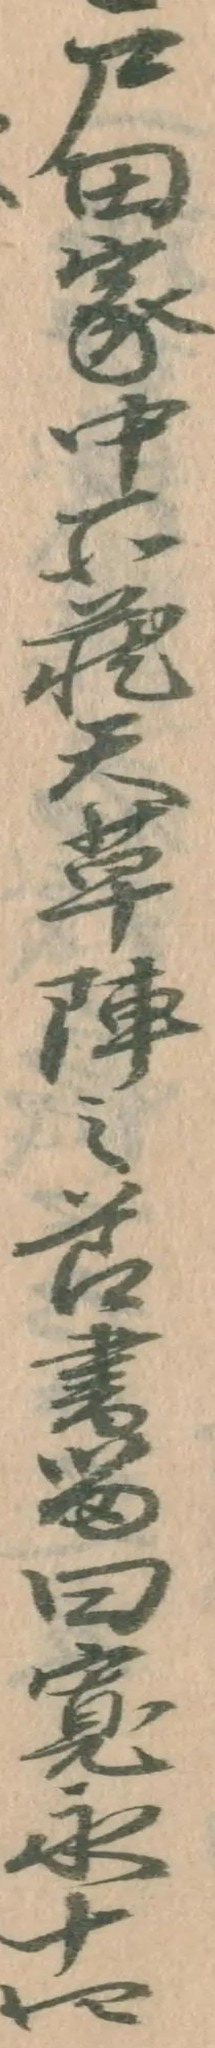戸田家中所蔵天草陣之節書留曰寛永十四
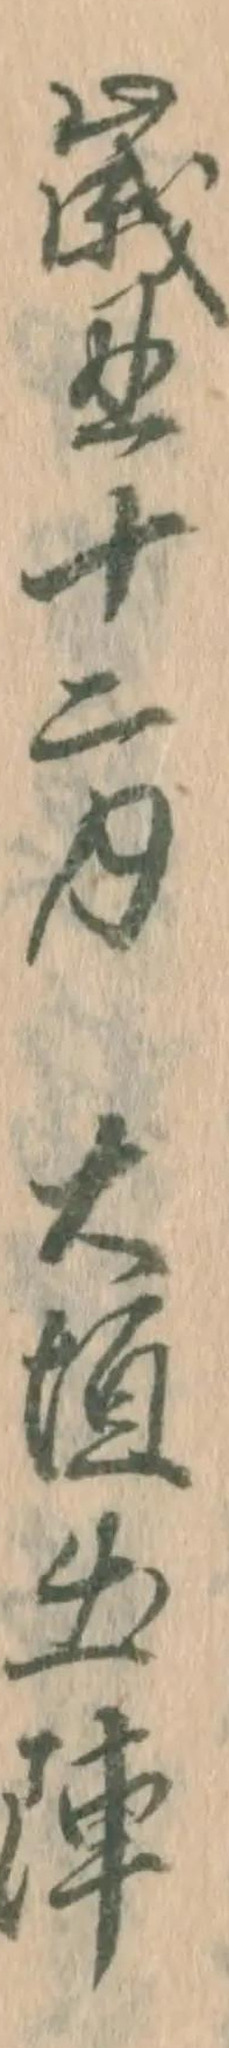歳丑十二月大垣出陣
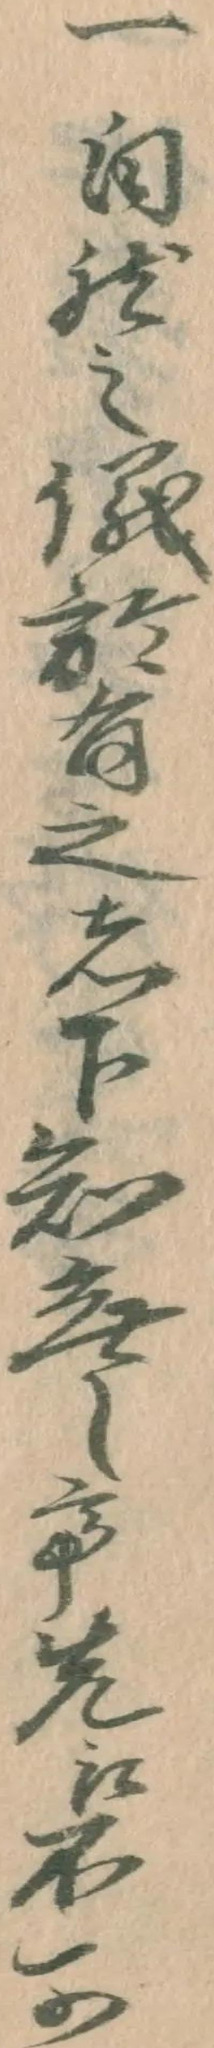一自然之儀於有之者下知無し亭先江不可
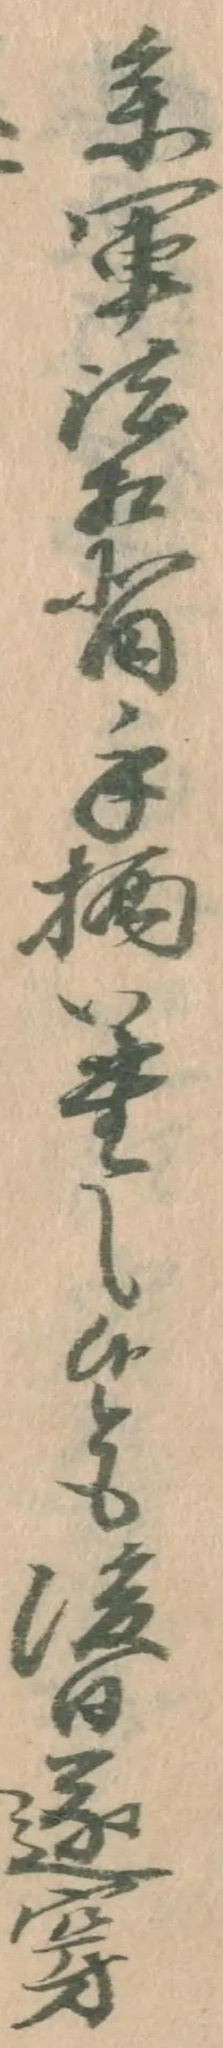参軍法相背手柄い堂し候とも後日遂穿
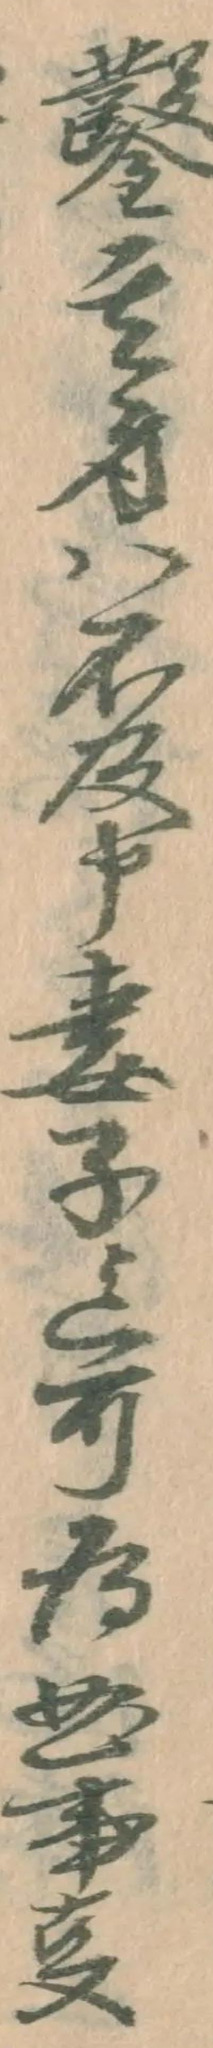鑿其身は不及申妻子迄可為怒事叓
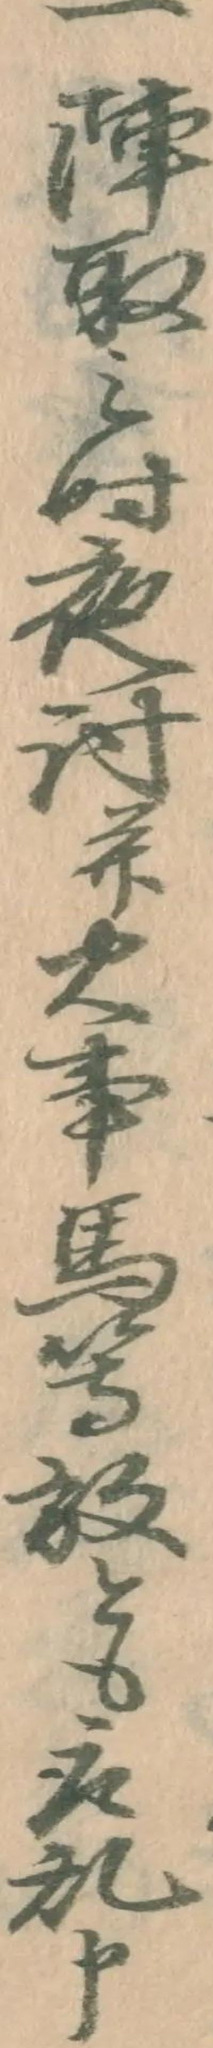一陣取之時夜討幷火事馬等放とも取乱申

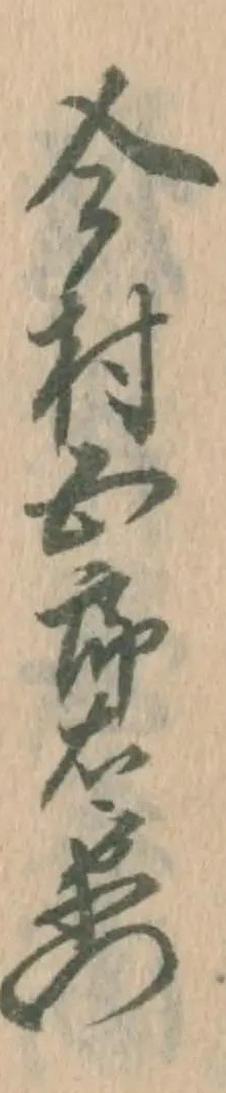同断今村五郎右衛門

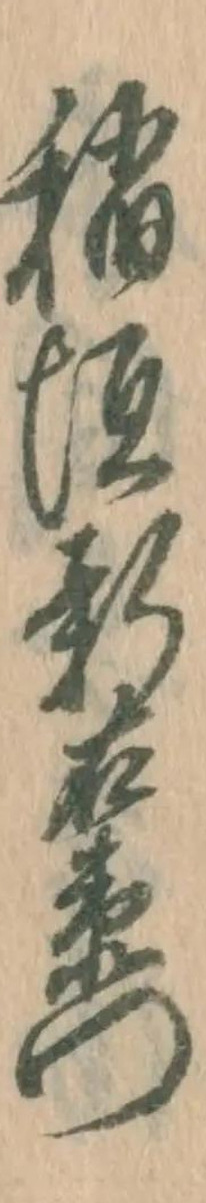同断稲垣新右衛門

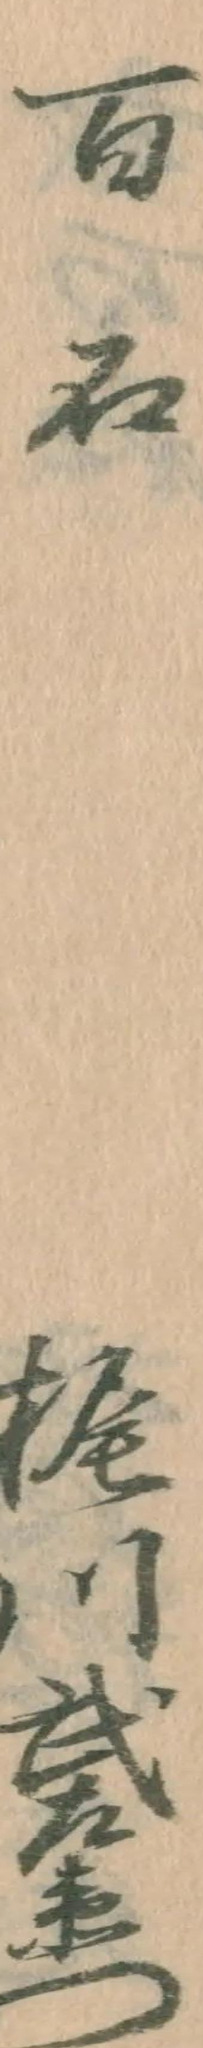百石梶川武左衛門
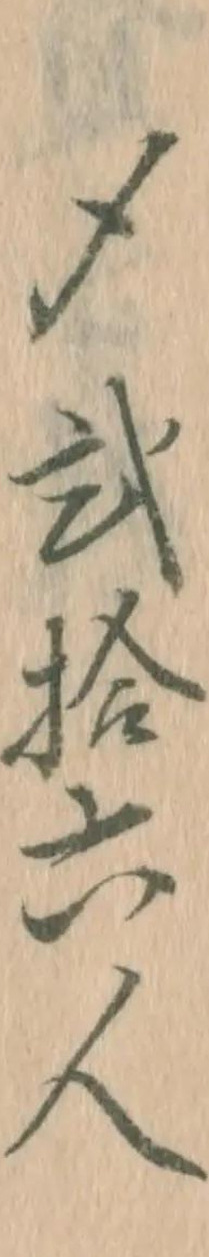〆弐拾六人

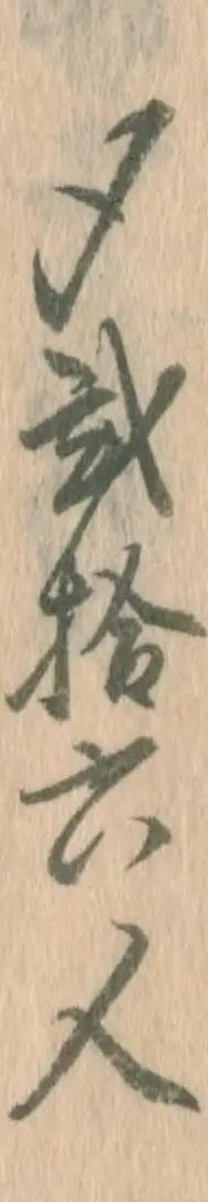〆弐拾六人
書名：切支丹御退治記 49巻. [4]
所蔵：国立国会図書館 National Diet Library, JAPAN
